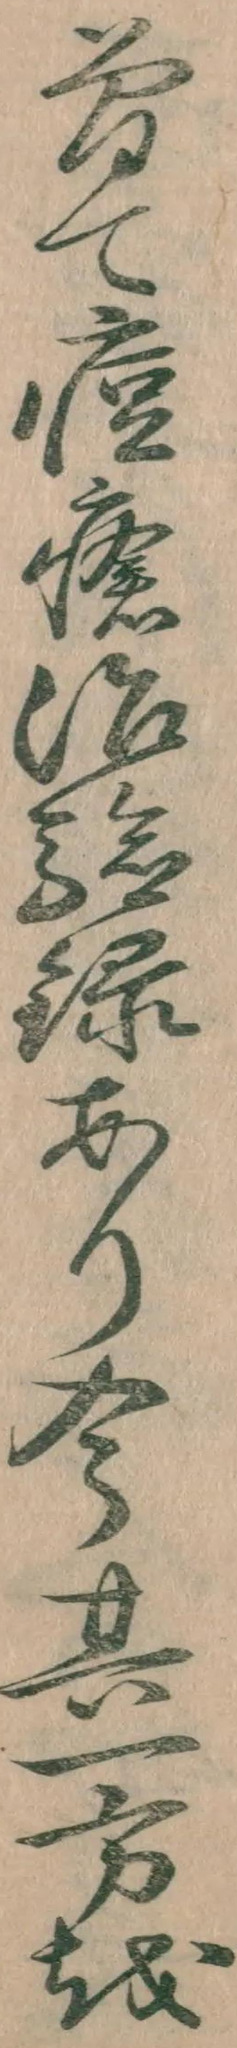曽て痘瘡治験録あり今其一方を
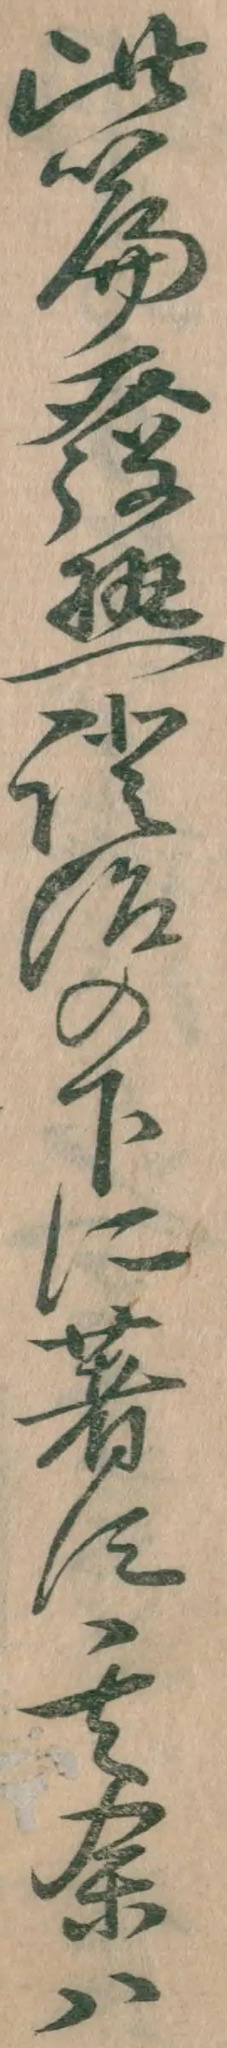此篇発熱証治の下に著す其余は

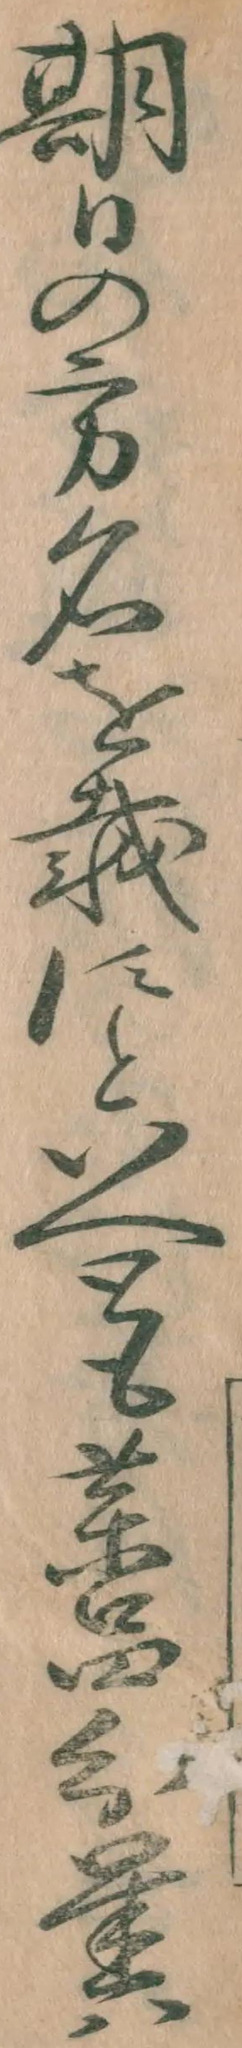期日の方名を載すといへとも薬品分量は
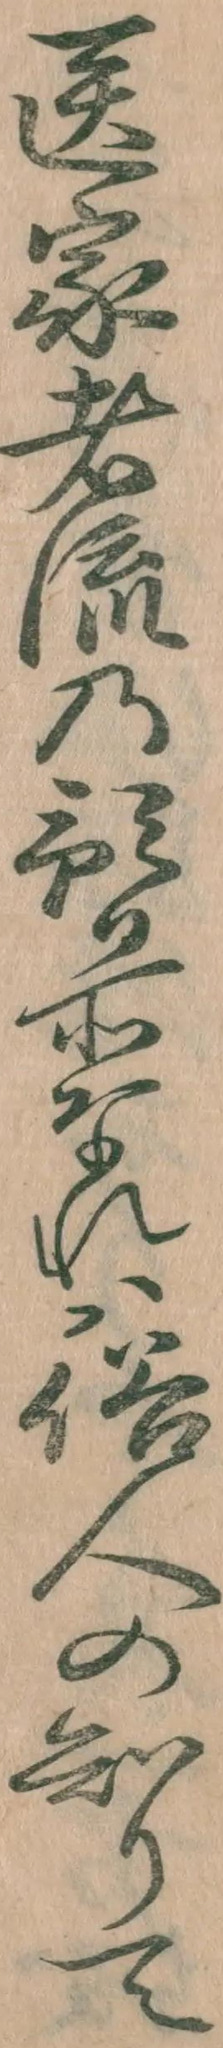医家者流の預る所なれは俗人の知りて
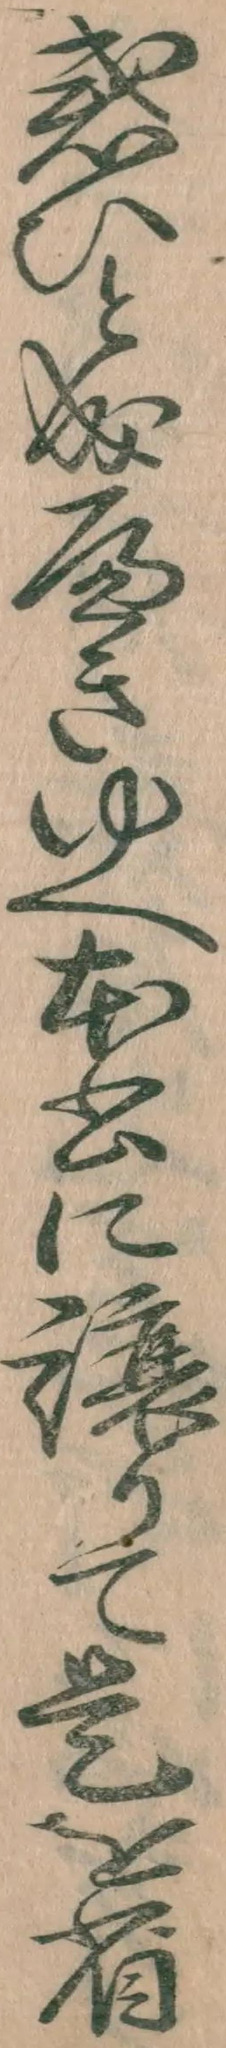惑ひと成へきゆへ本書に譲りて是を省
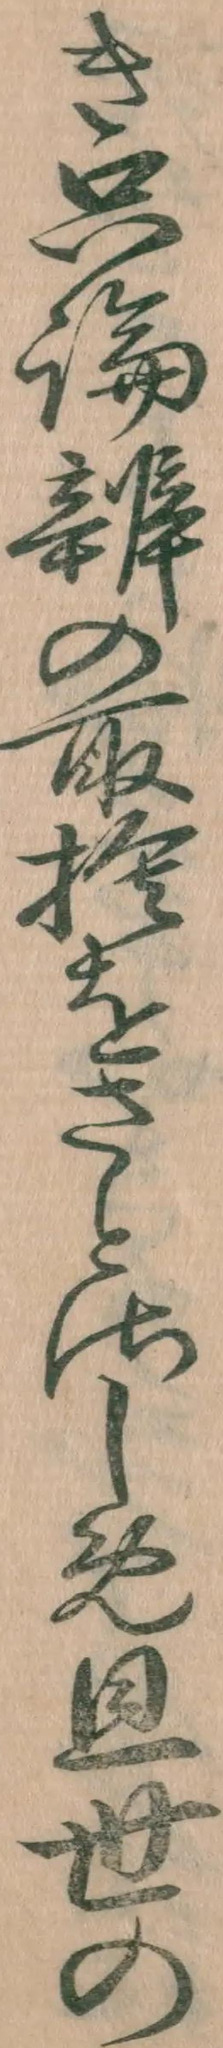き只論弁の取捨をさとさしめ且世の
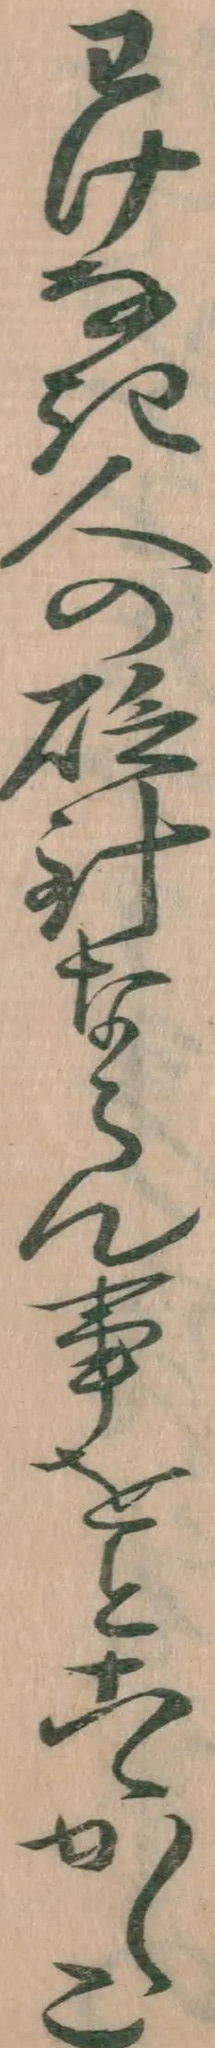わけなき人の砭針ならん事をとこゝかしこ
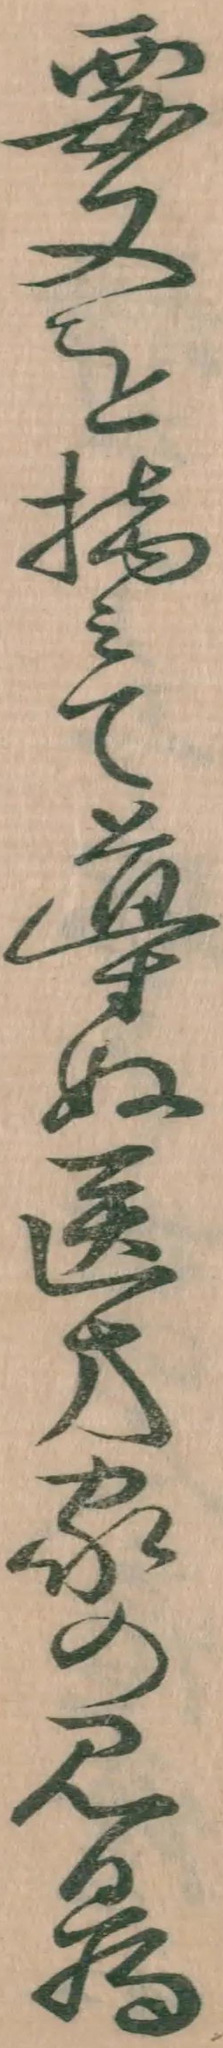要又を指みて導ぬ医方家の見る爲
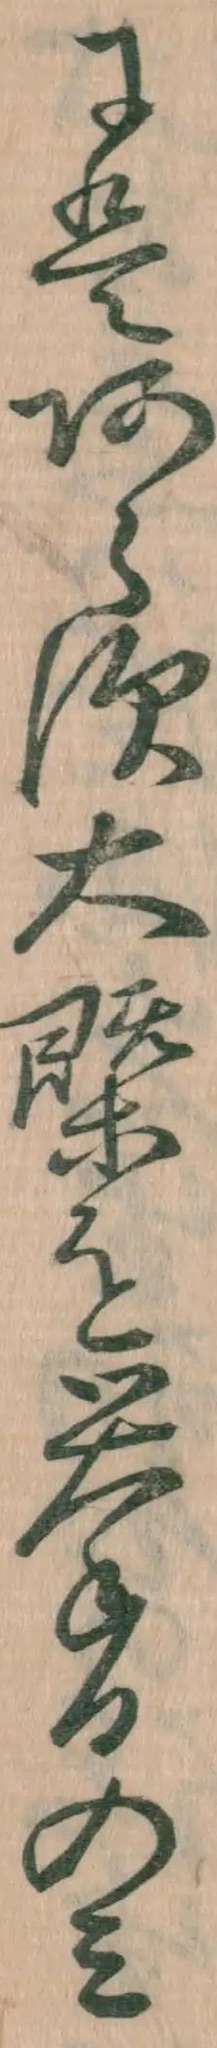にはあらす大槩を挙るのみ
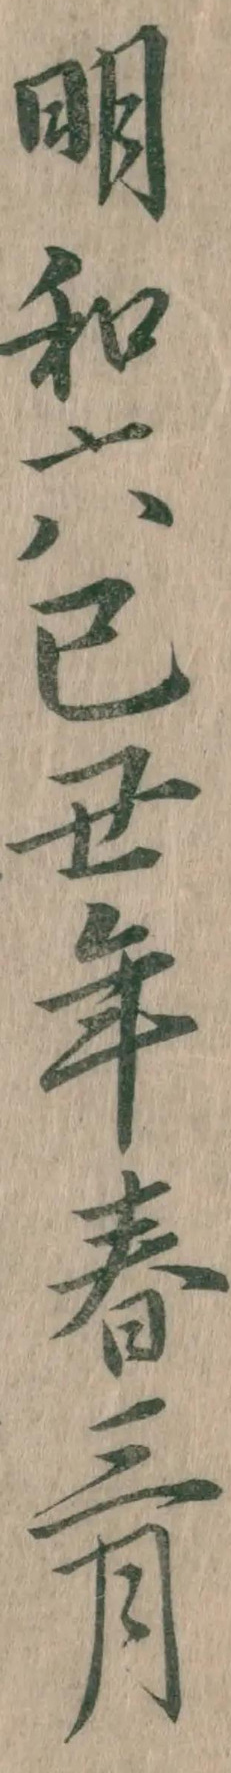明和六己丑年春三月
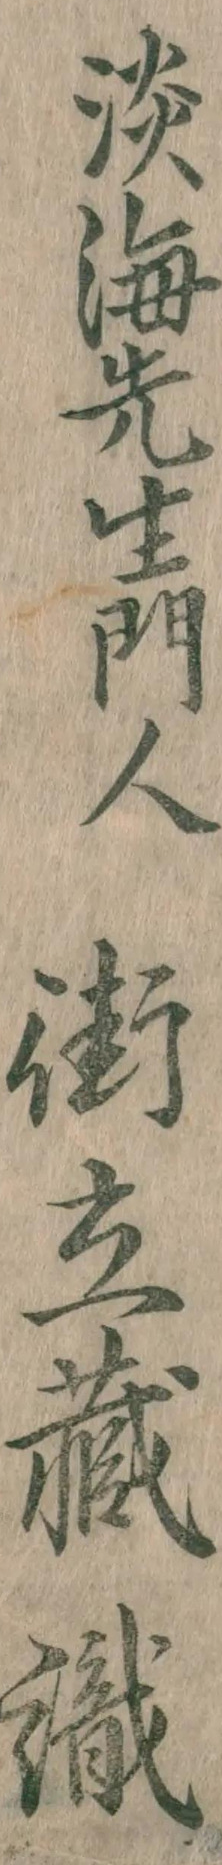淡海先生門人街立蔵識
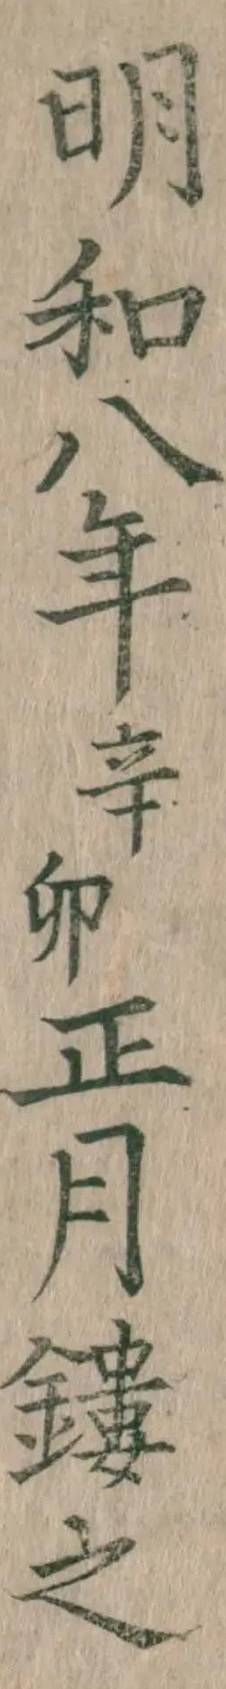明和八年辛卯正月鏤也
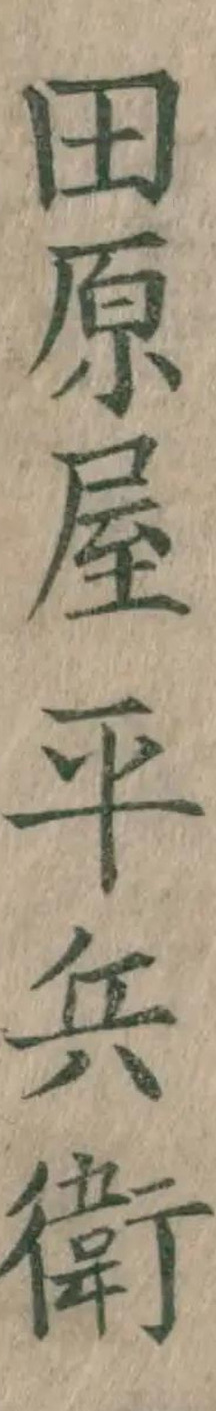田原屋平兵衛
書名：痘家初心問答
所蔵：国立国会図書館 National Diet Library, JAPAN
